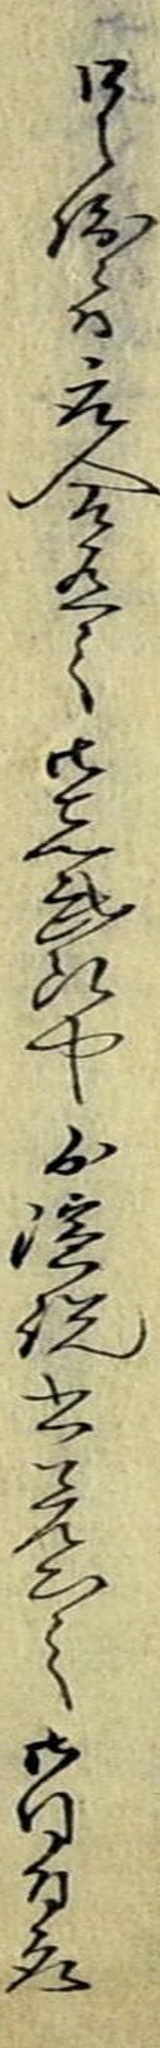口之儀に付取合有之御先武頭中ゟ演説書差出之御目付取
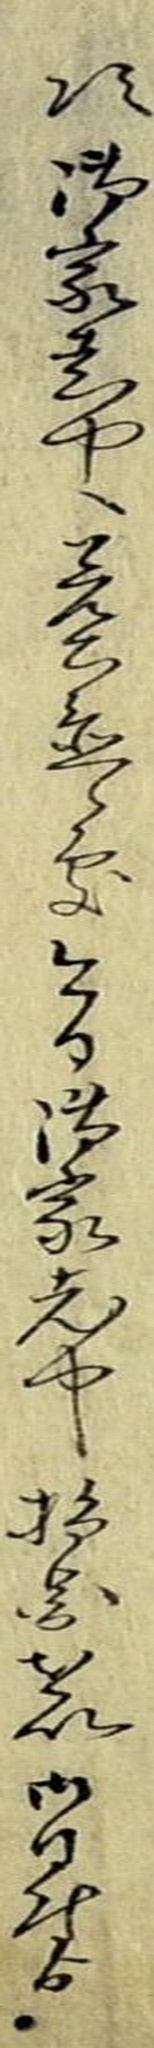次御家老中へ差出置候処今日御家老中指図を以御目付ゟ
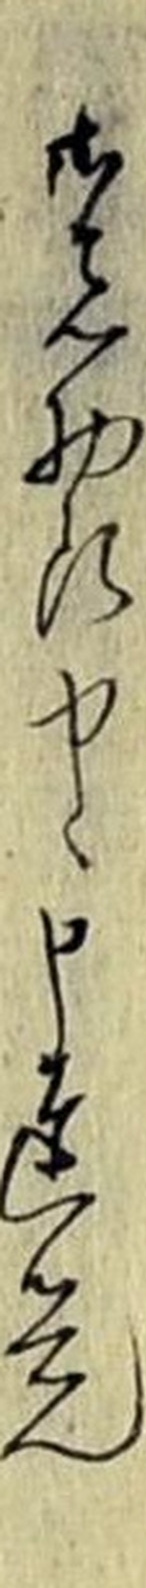御先物頭中へ申達覚
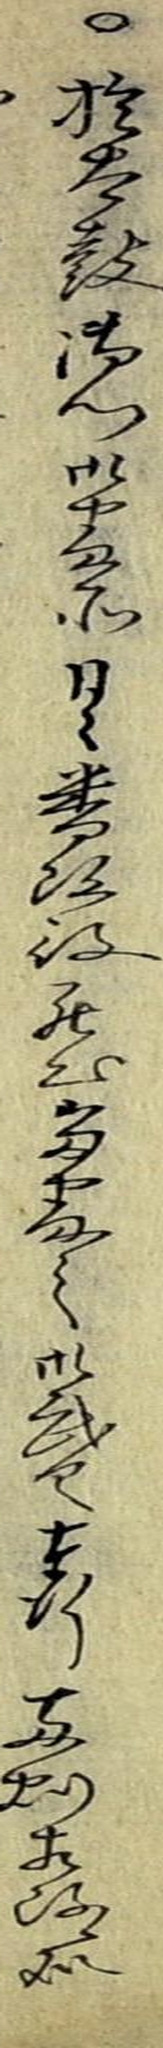○於太鼓御門御番所日々番改役罷出当番之御武具奉行両判相改候処
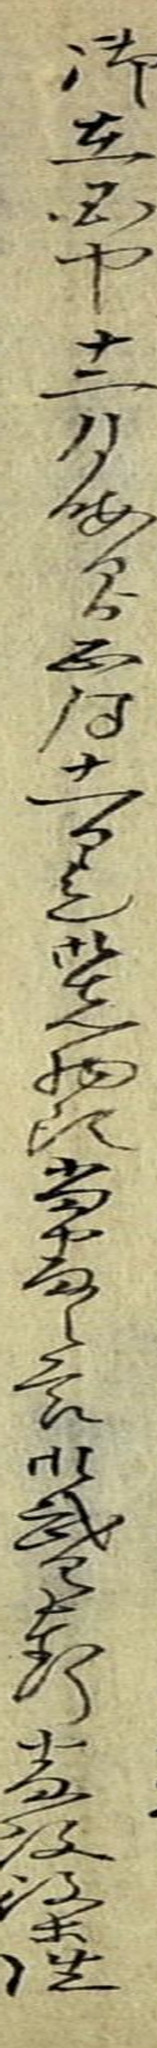御在国中十二月晦日ゟ正月十一日迄御先物頭当番之節御武具奉行番改役等往
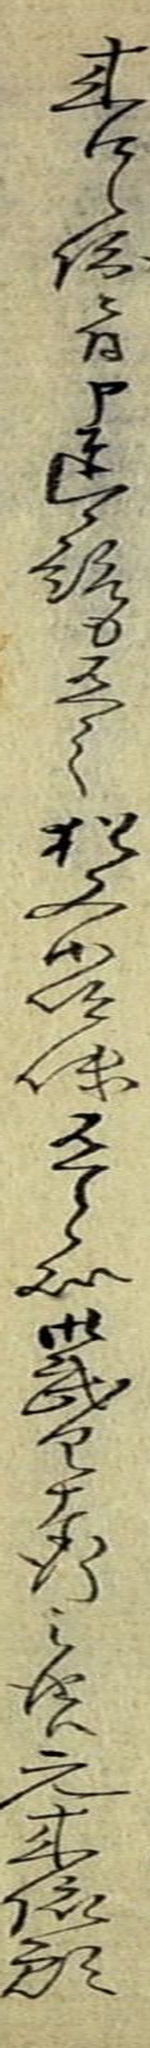来口之儀に付申達候趣も有之猶又御吟味有之候処御武具奉行之儀は元来依願
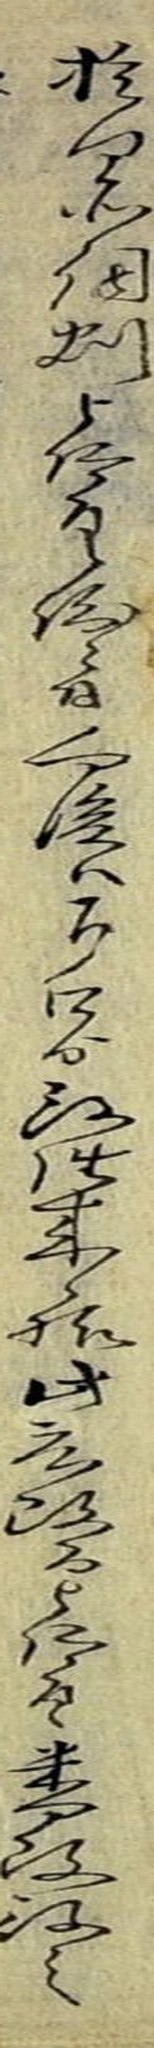於同所調判被仰付候儀に付向後は下ノ口ゟ致往来候様此度改而被仰付候番改役之
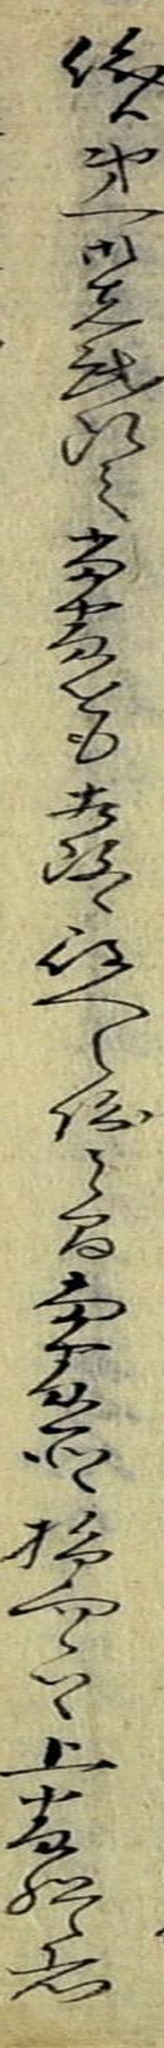儀は第一御先武頭之当番とも相改候役人之儀に候間当番所へ指向候はヽ上番組之者
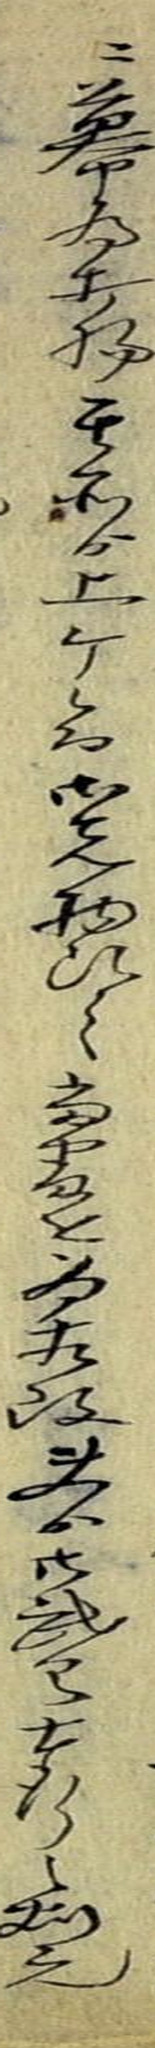に幕為打揚其所ゟ上ヶ候而御先物頭之当番を為相改夫ゟ御武具奉行之判元
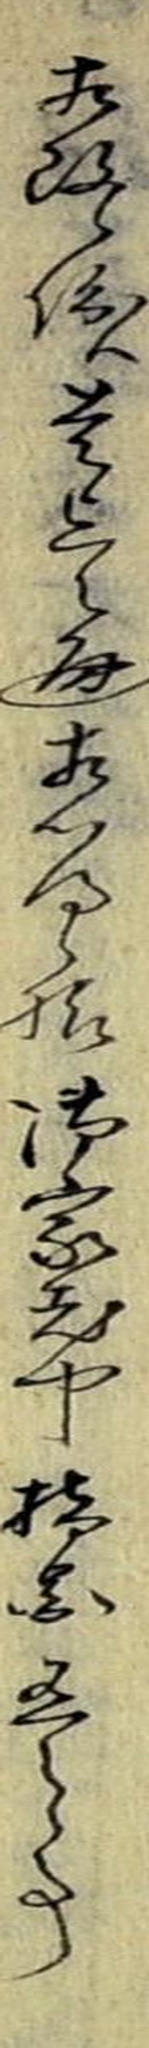相改候儀は是迄之通相心得候様御家老中指図有之候事
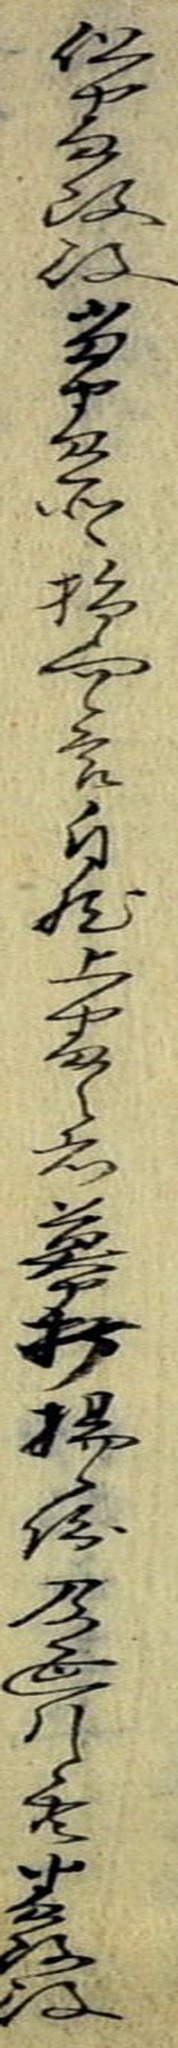但番改役当番所へ指向候節自然上番之者幕打揚候儀及延引候共番改役
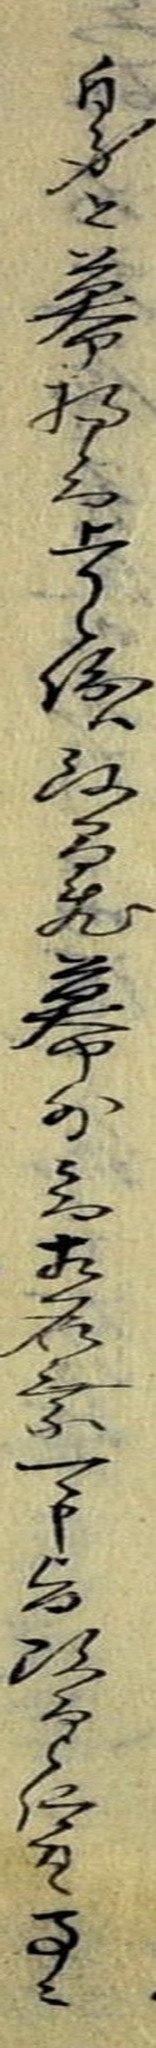自身と幕揚候而上り候儀は改間敷幕外に而相名乗可申旨改而被仰付候事に
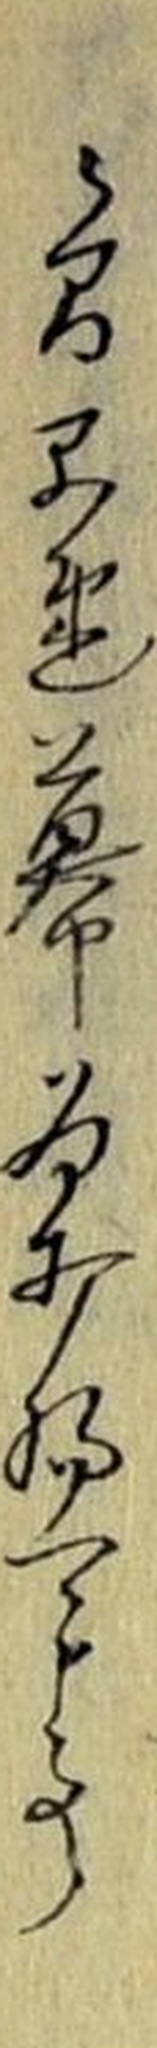候間早速幕為打揚可申事
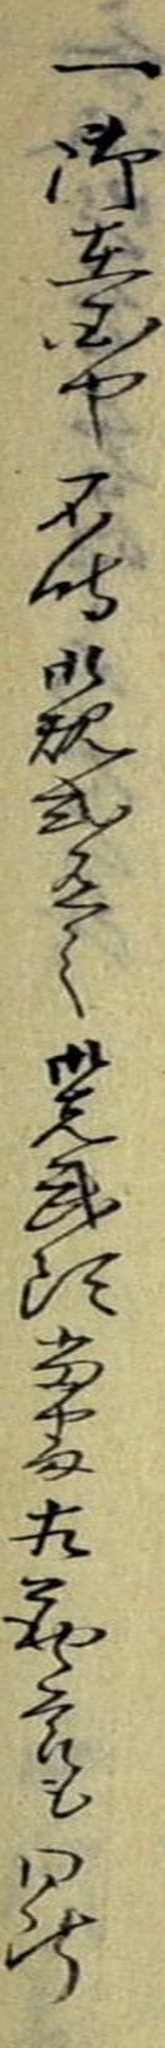一御在国中不時御規式有之御先武頭当番相勤候節も同断
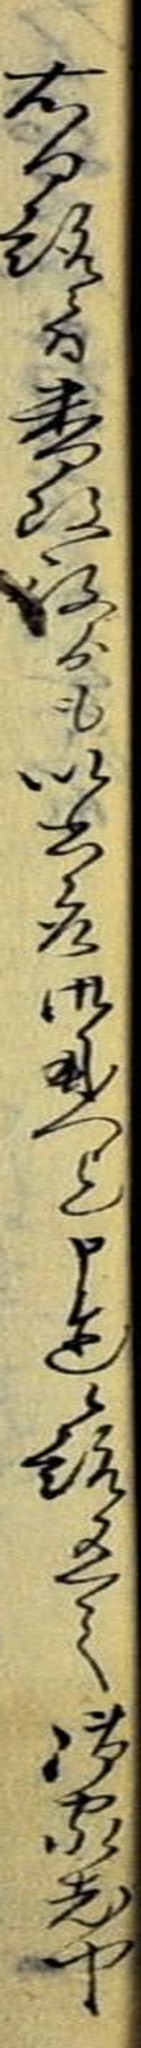右同趣に付番改役ゟも以書取御用人迄申達候趣有之御家老中
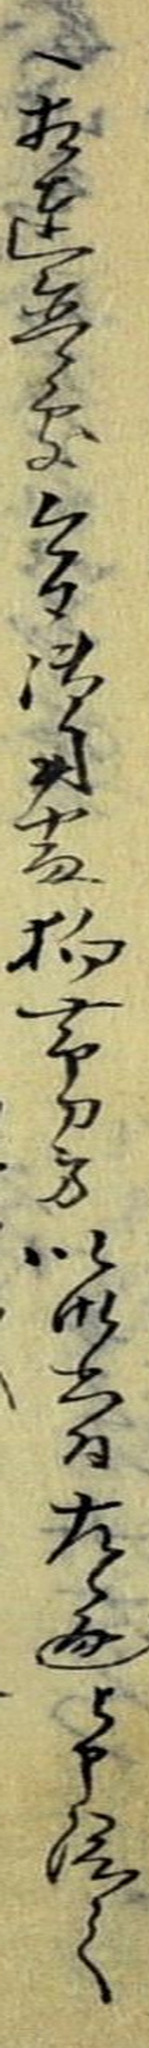へ相達置候処今日御用番狛犬帯刀方以御書付左之通被申渡之
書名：命令之部 六
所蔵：福井県文書館 Fukui Prefectural Archives
